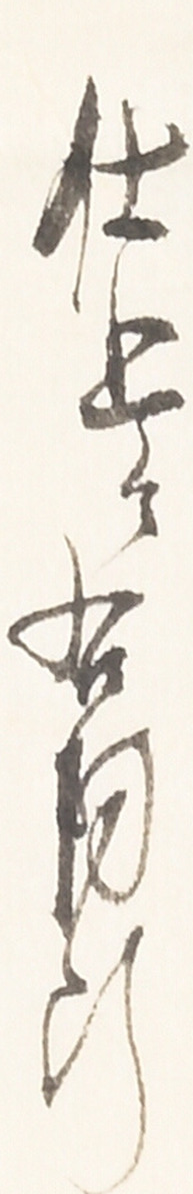仕上ヶ右同断
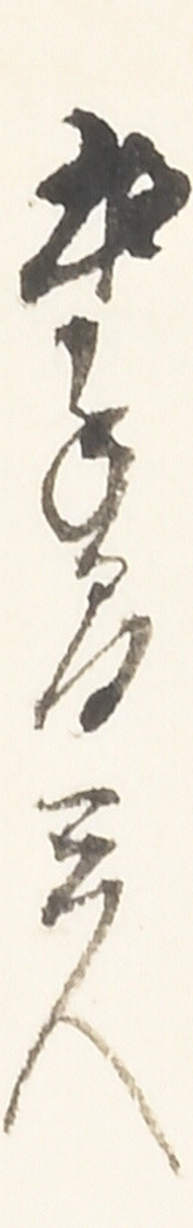此手間三人
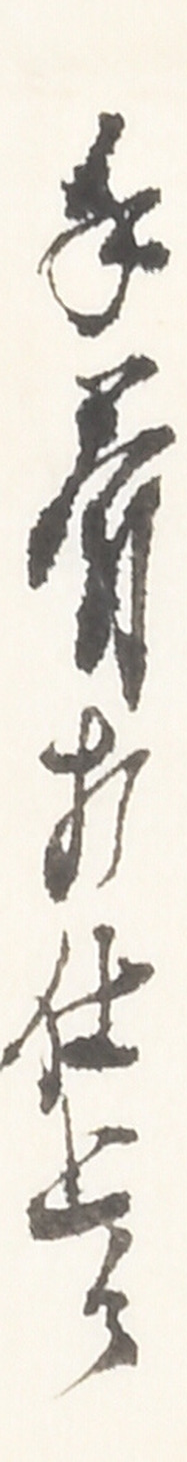手斧打仕上ヶ
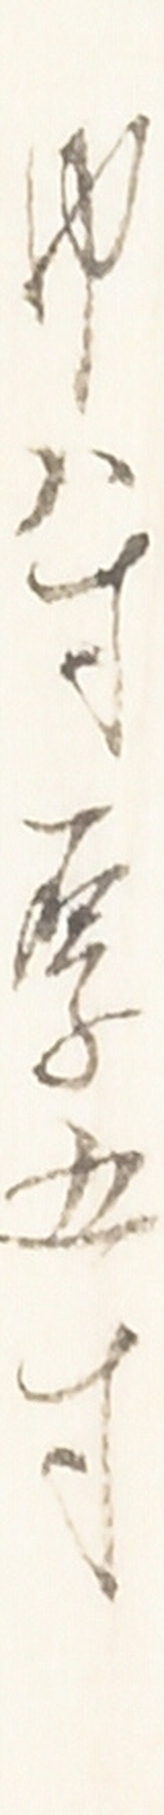巾壱尺厚五寸
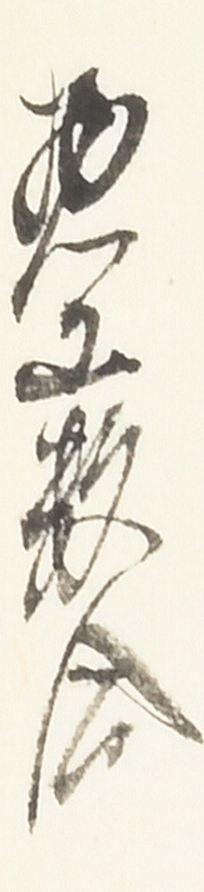惣工数合
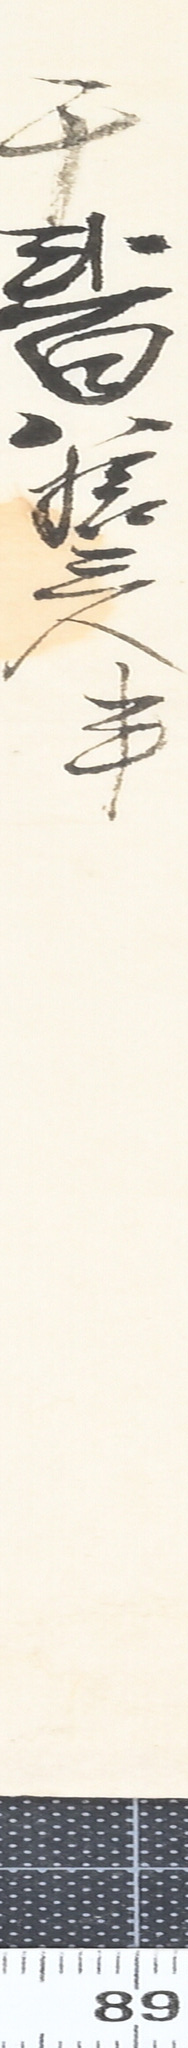千弐百八拾三人半
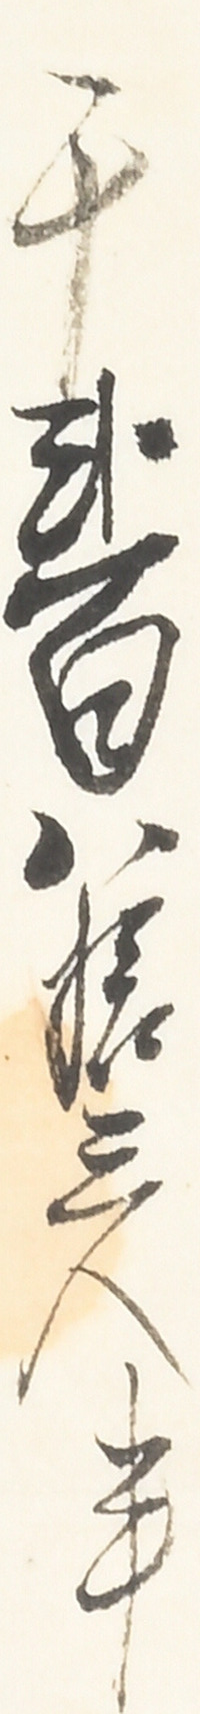千弐百八拾三人半
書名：天保十一年四月十六日岩窪御廟御普請仕様帳扣
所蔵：伊那市立高遠町図書館・合同会社AMANE
